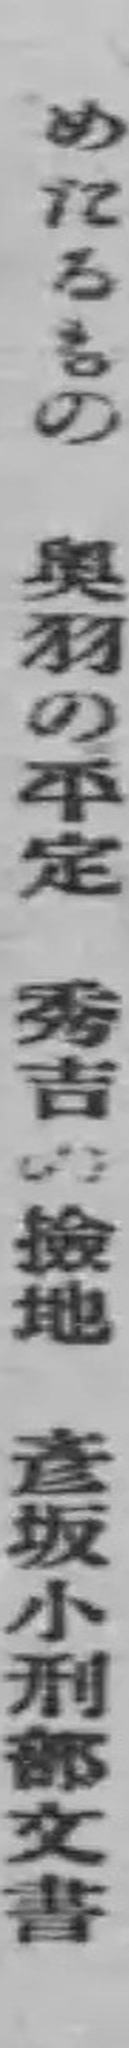めたるもの奥羽の平定秀吉の検地彦坂小刑部文書
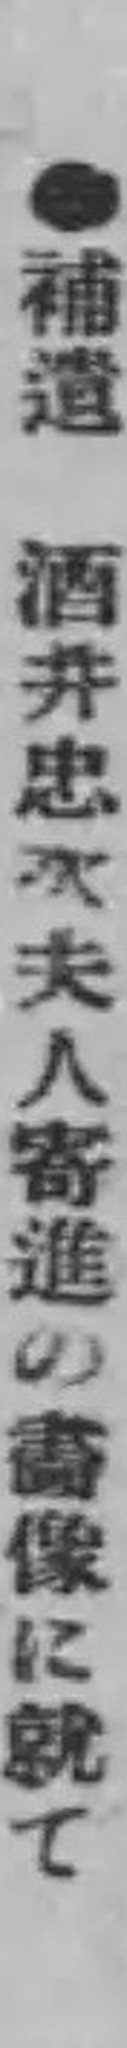●補遺酒井忠次夫人寄進の画像に就て
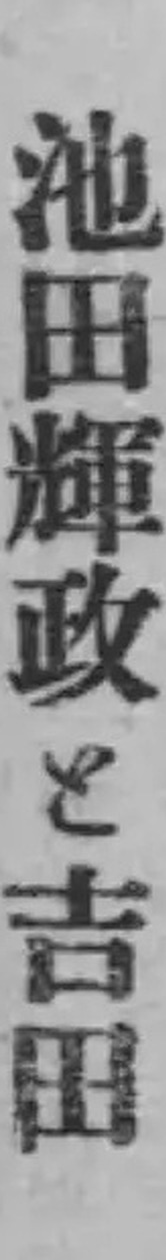池田輝政と吉田

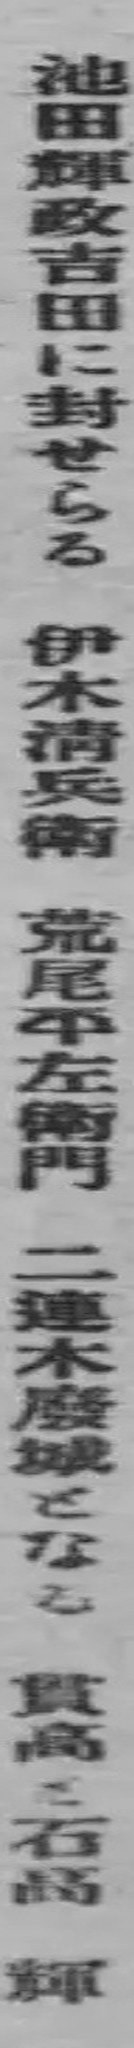池田輝政吉田に封せらる伊木清兵衛荒尾平左衛門二連木廃城となる貫高と石高輝
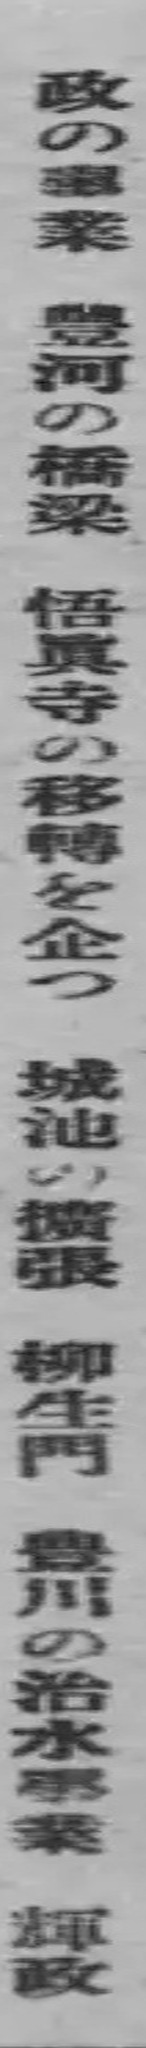政の事業豊河の橋梁悟眞寺の移転を企つ城池の拡張柳生門豊川の治水事業輝政
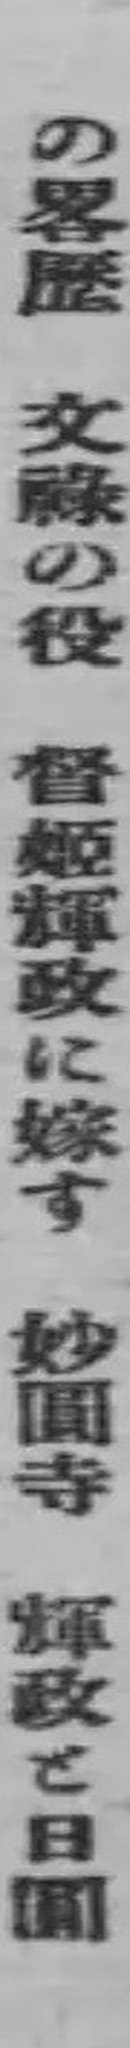の略歴文禄の役督姫輝政に嫁す妙円寺輝政と日円
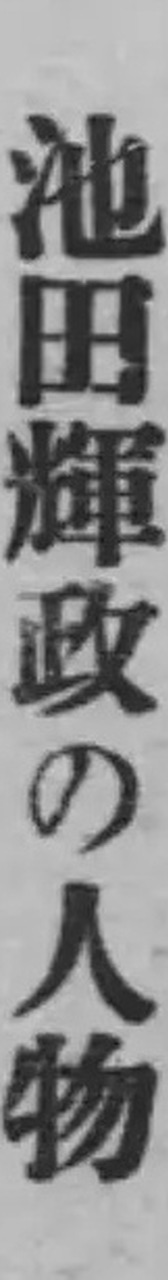池田輝政の人物
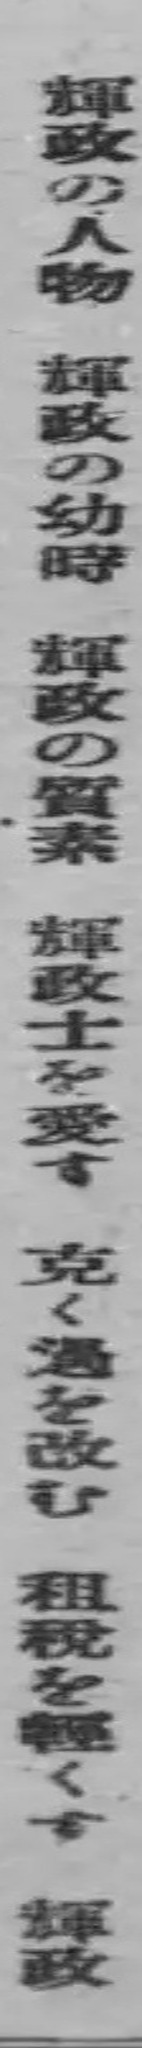輝政の人物輝政の幼時輝政の質素輝政士を愛す克く過を改む租税を軽くす輝政
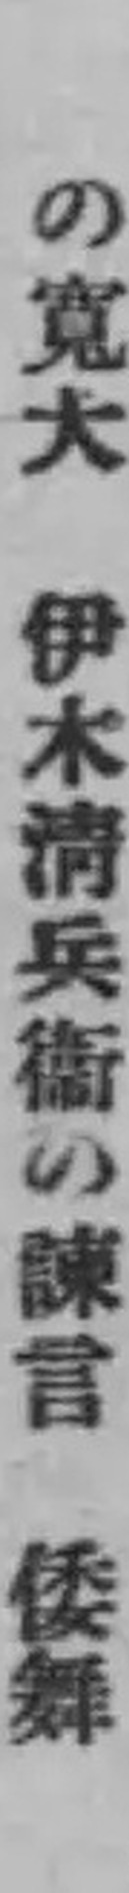の寛大伊木清兵衛の諫言倭舞
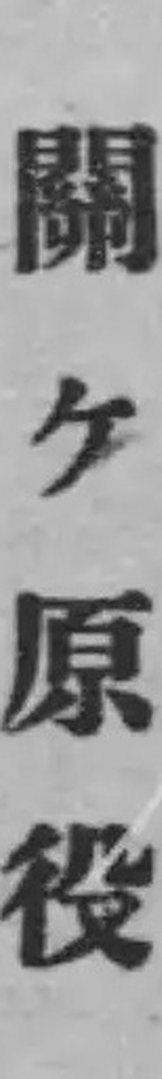関ケ原役
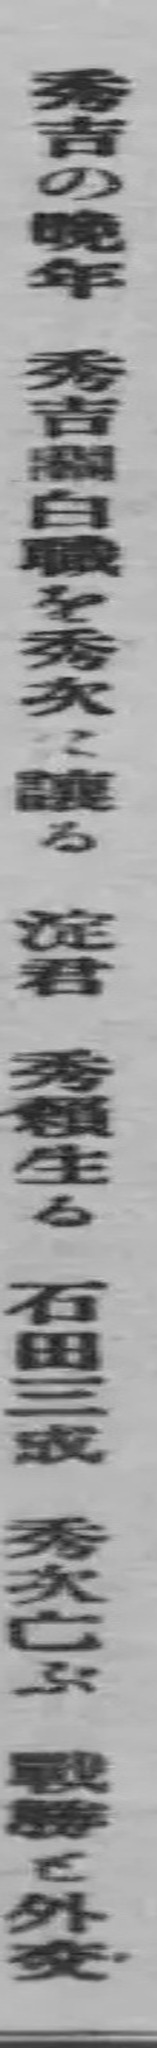秀吉の晩年秀吉関白職を秀次に譲る淀君秀頼生る石田三成秀次亡ぶ戦勝と外交
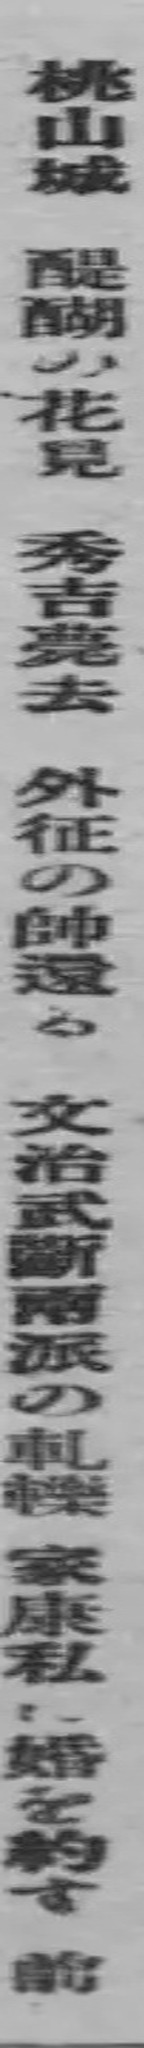桃山城醍醐の花見秀吉薨去外征の師還る文治武断両派の軋轢家康私に婚を約す前
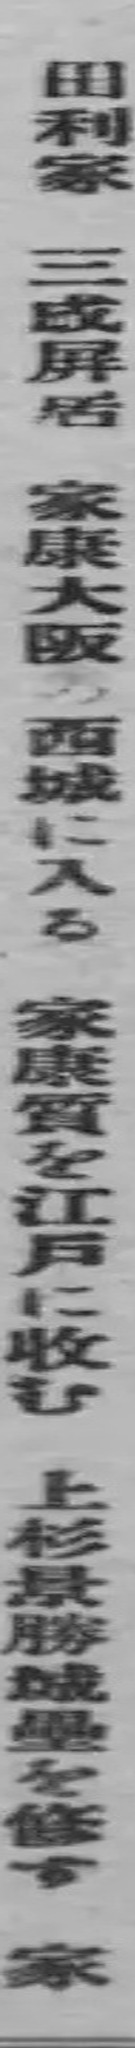田利家三成屏居家康大阪の西城に入る家康質を江戸に収む上杉景勝城塁を修す家
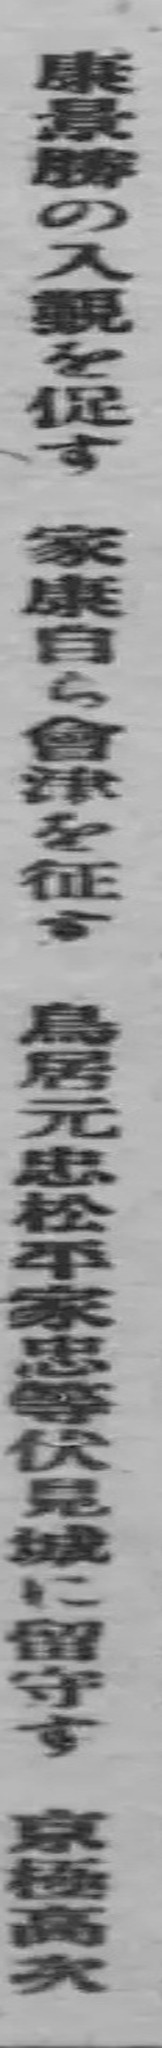康景勝の入観を促す家康自ら会津を征す鳥居元忠松平家忠等伏見城に留守す京極高次
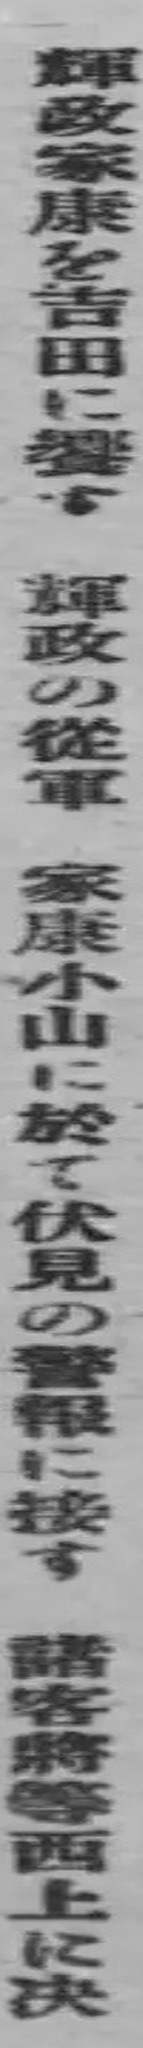輝政家康を吉田に饗す輝政の従軍家康小山に於て伏見の警報に接す諸客将等西上に決
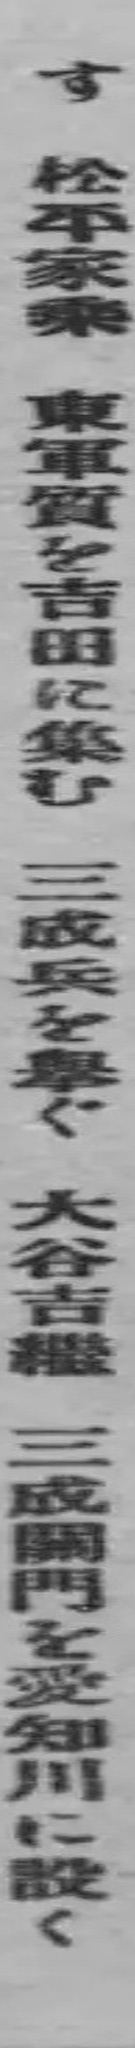す松平家乗東軍質を吉田に集む三成兵を挙ぐ大谷吉継三成関門を愛知川に設く
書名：豊橋市史談
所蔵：国立国会図書館 National Diet Library, JAPAN
